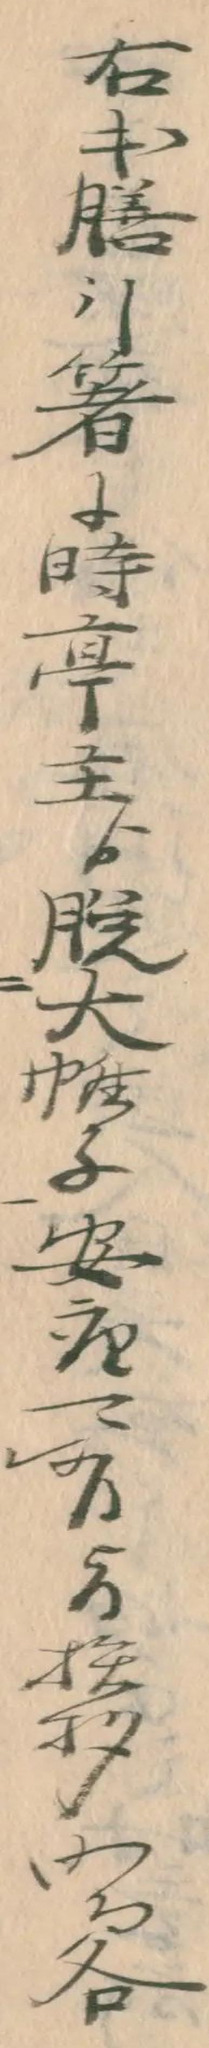右本膳引箸于時亭主ゟ脱大帷子安座可有旨挨拶仍而各
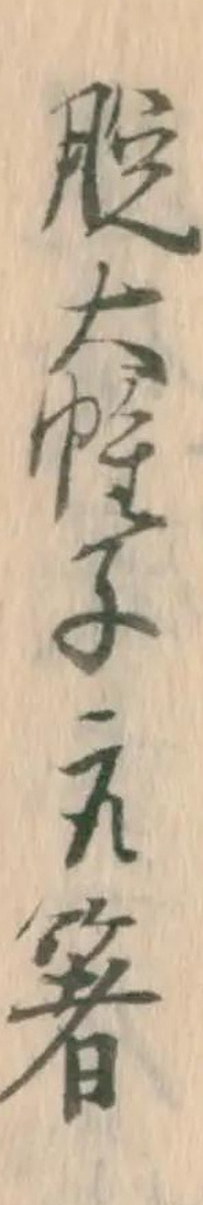脱大帷子取箸
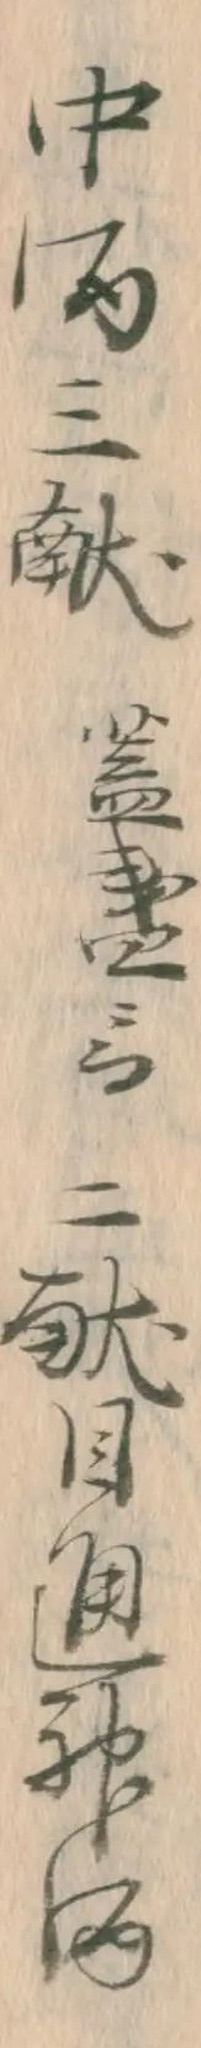中酒三献蓋盞ニ而二献目通神酒
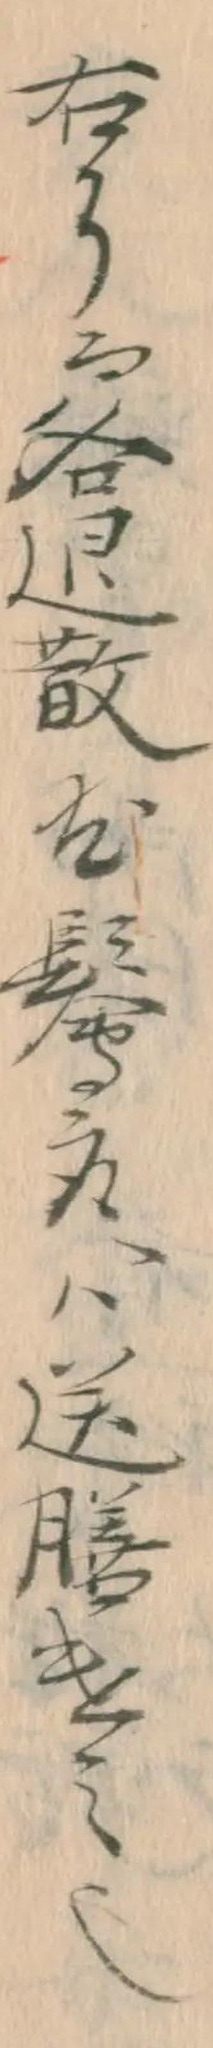右了而各退散尤鬠取ヘハ送膳遣之也
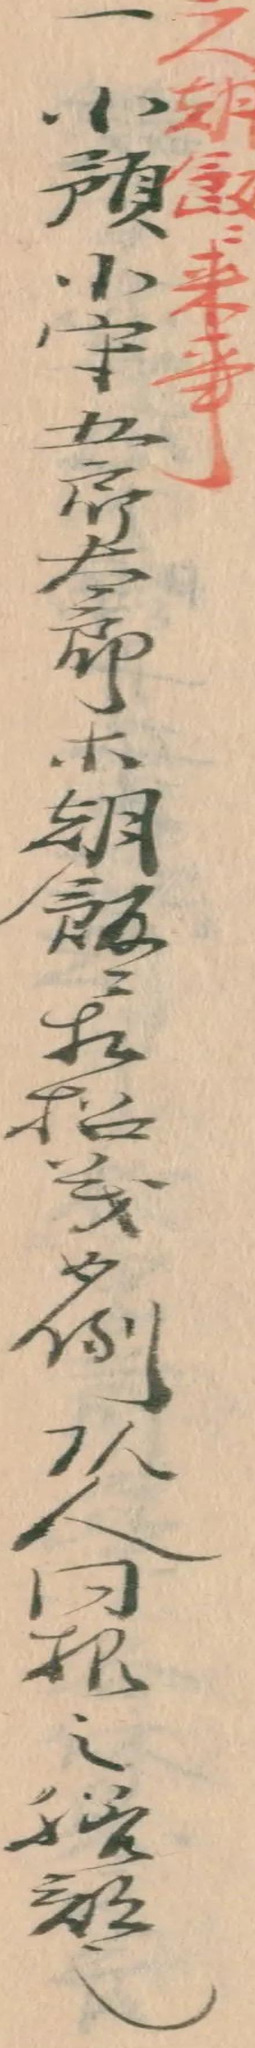一小預小守五郎太郎等朝飯ニ相招義如例頭人同様之膳部也
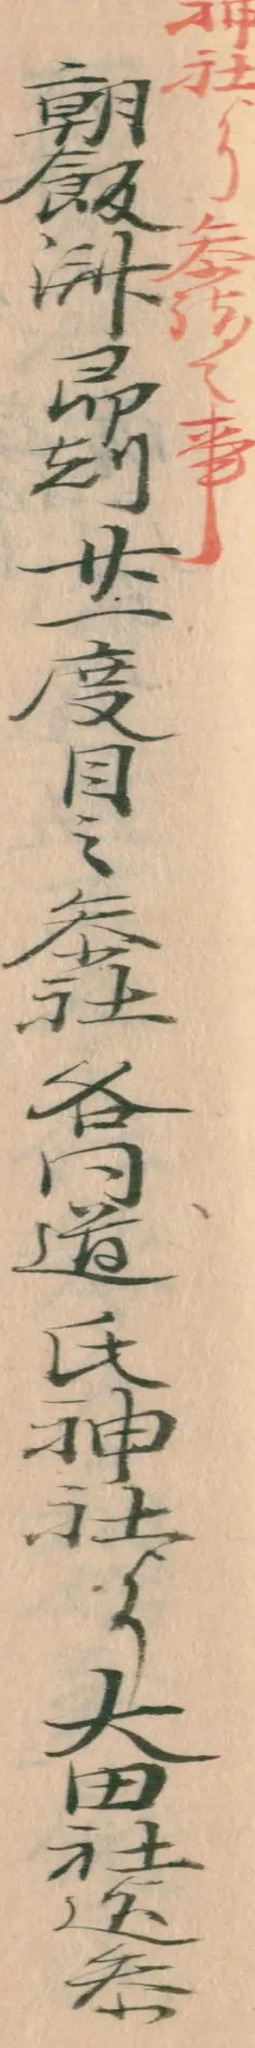一朝飯済即刻廿一度目之参社各同道氏神社より大田社迄参
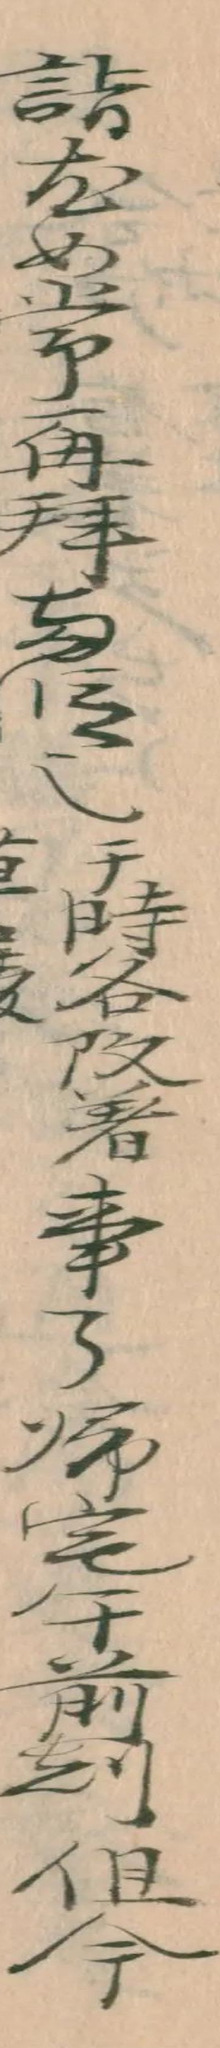詣尤如常再拝両段也于時各改着草履事了帰宅午前刻但今
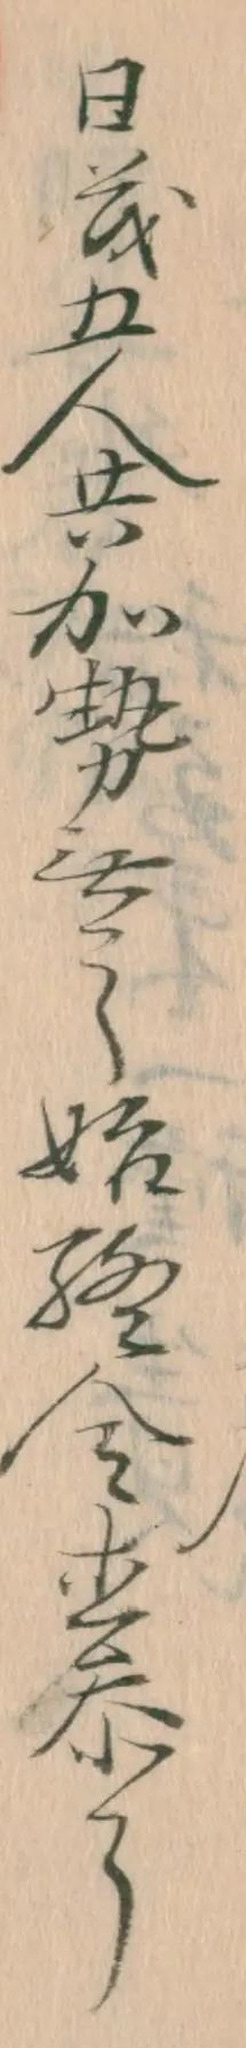日も五人共加勢無之始終令直参了
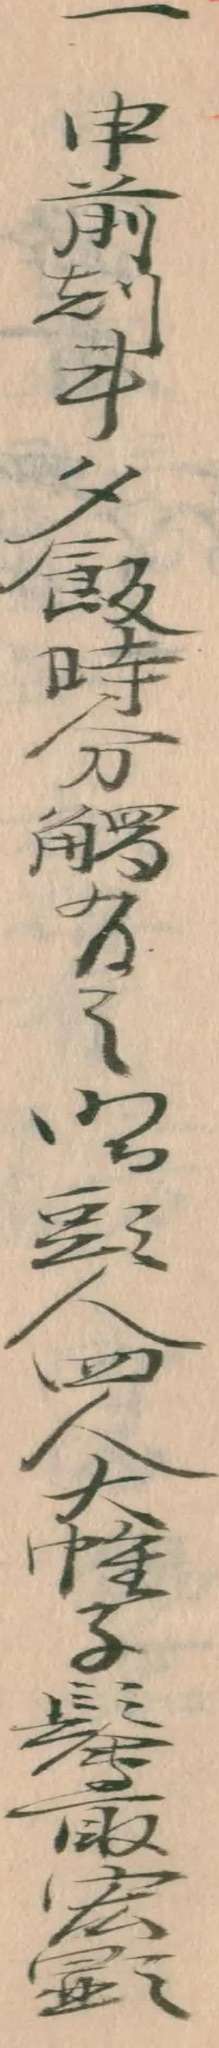一申前刻斗夕飯時分觸有之仍而頭人四人大帷子鬠取宏顕
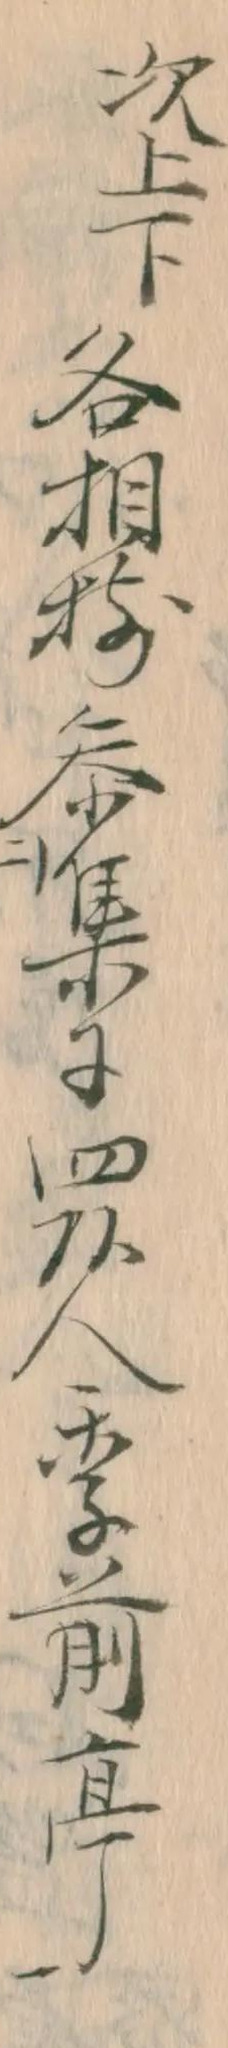次上下各相揃参集に四頭人季前亭
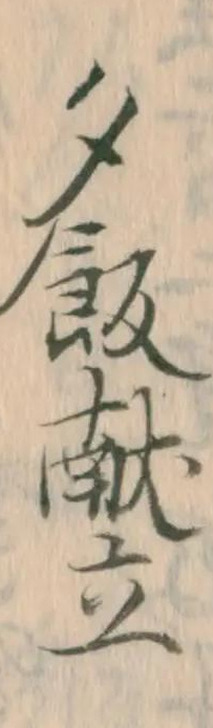夕飯献立

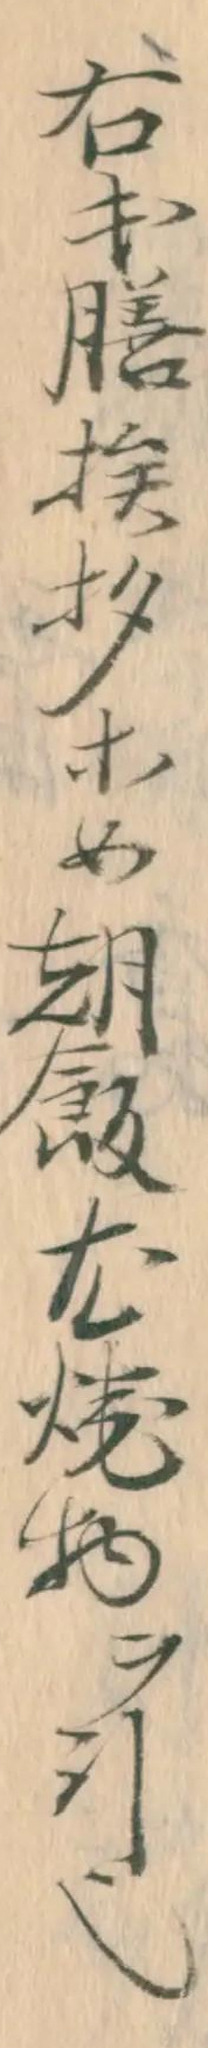右出膳挨拶等如朝飯尤焼物を引也
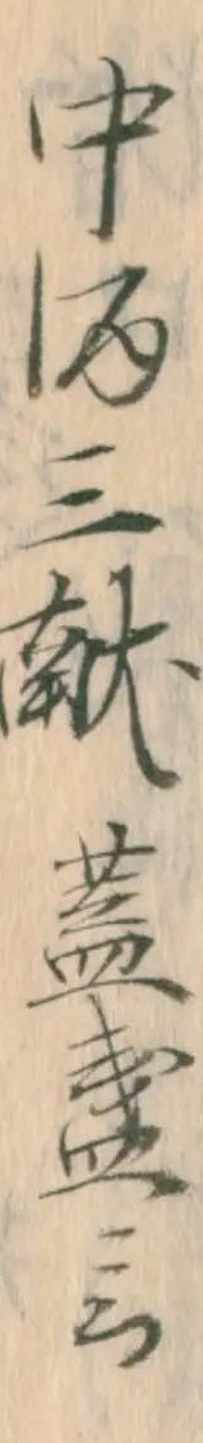中酒三献蓋盞ニ而
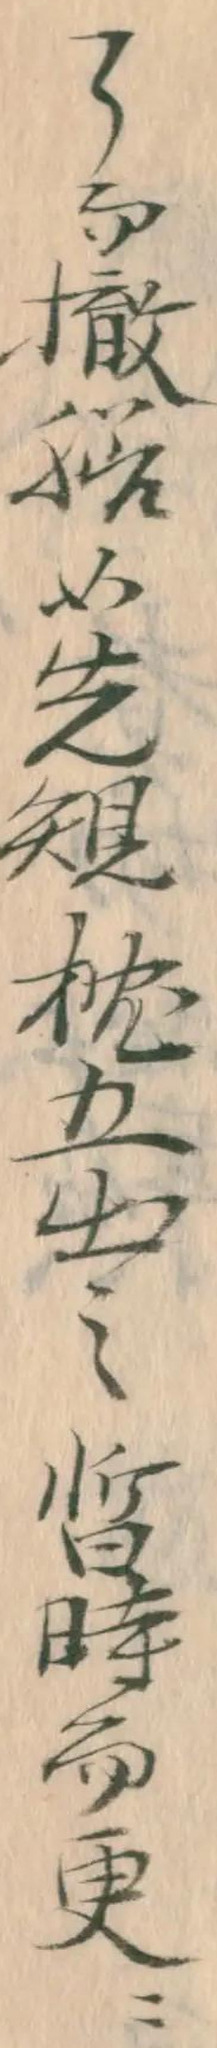了而撒膳如先規枕五出之暫時而更ニ
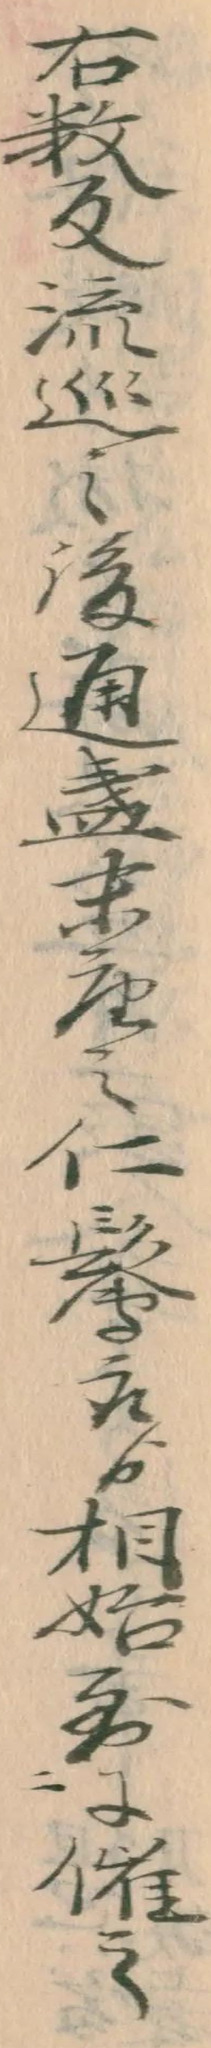右数反流巡之後通盞末座之仁鬠取ゟ相始至于催之
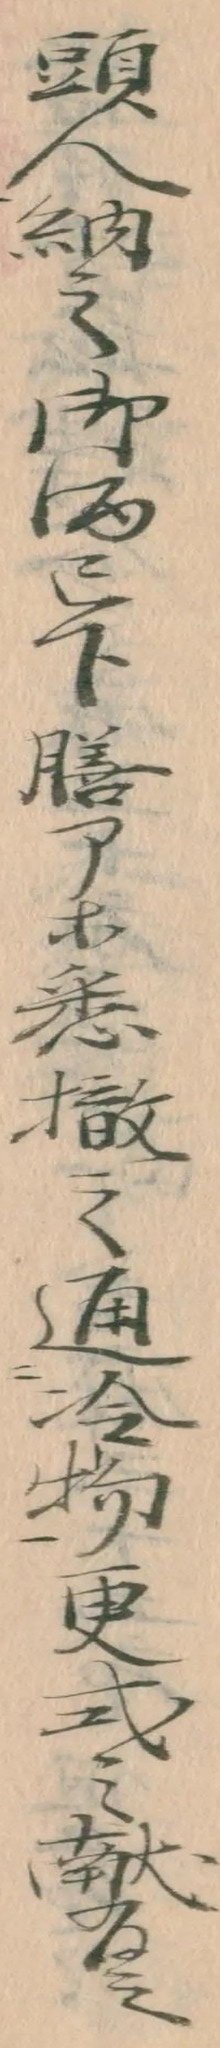頭人納之御酒已下膳部等悉撤之通冷物更式之献有之
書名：賀茂社記録. 第74冊
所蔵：国立国会図書館 National Diet Library, JAPAN
